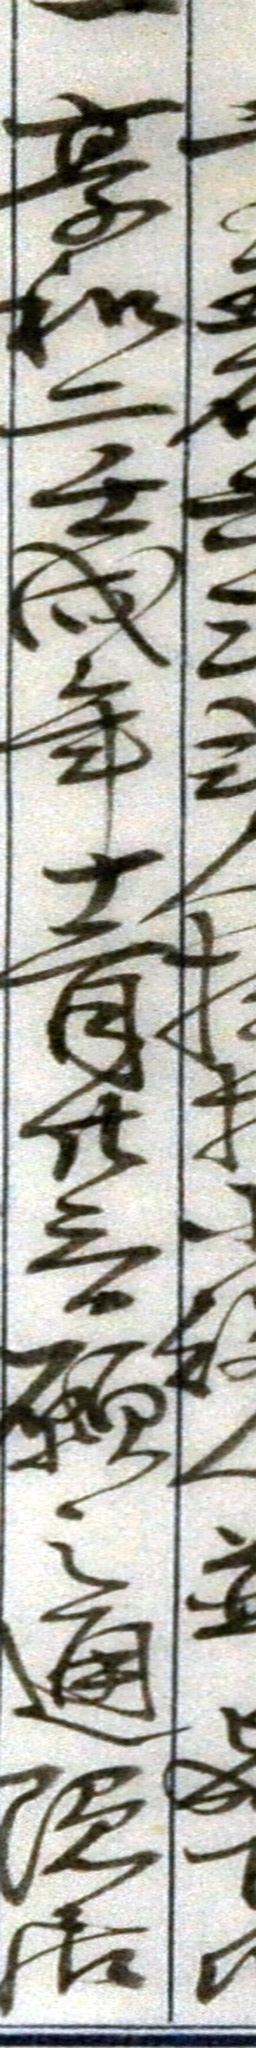一享和二壬戌年十二月廿三日願之通隠居
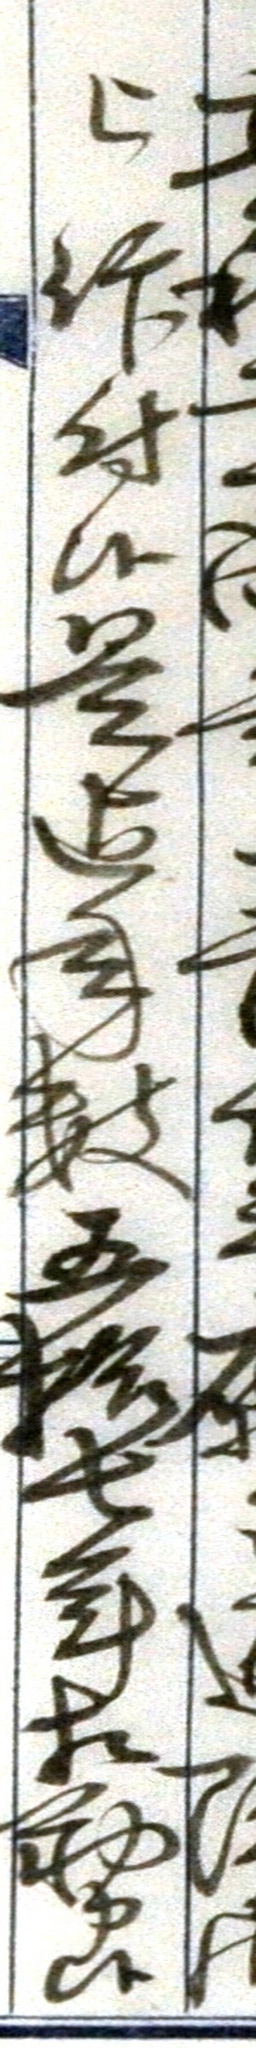被仰付候是迄年数五拾七年相勤申候

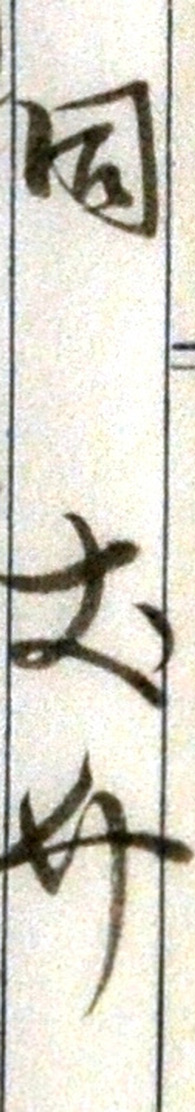同丈介
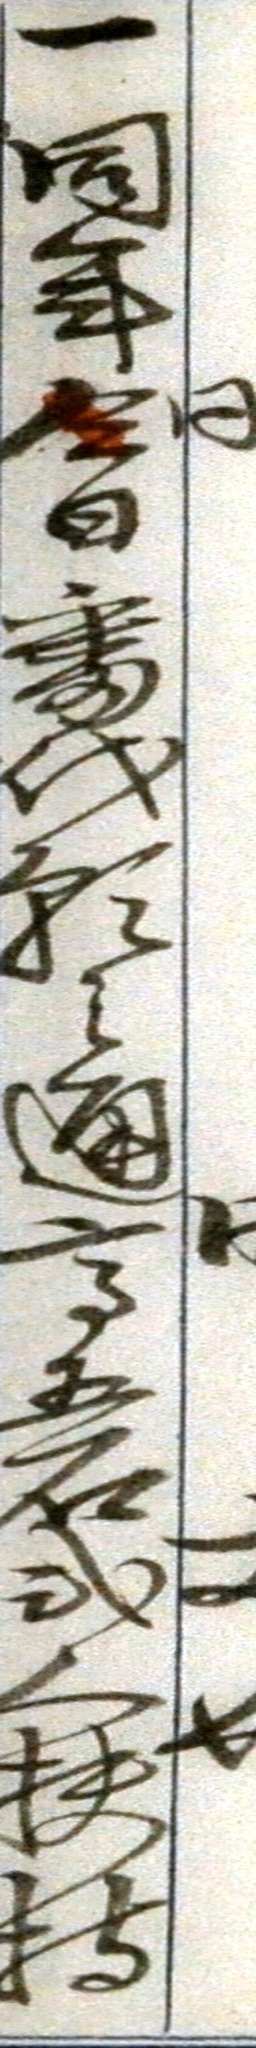一同年同日番代願之通高五石弐人扶持
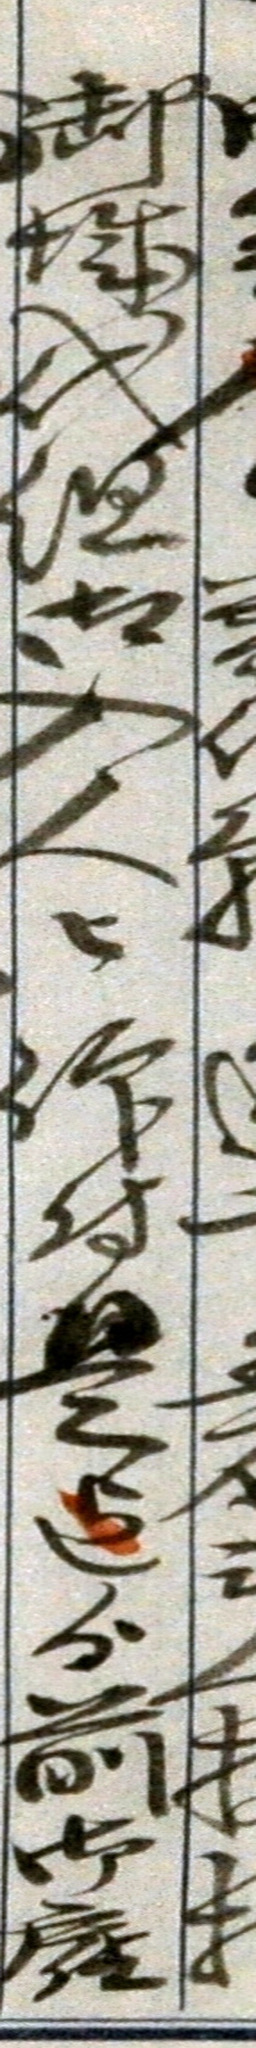御城代但御入人被作付是ゟ前御雇
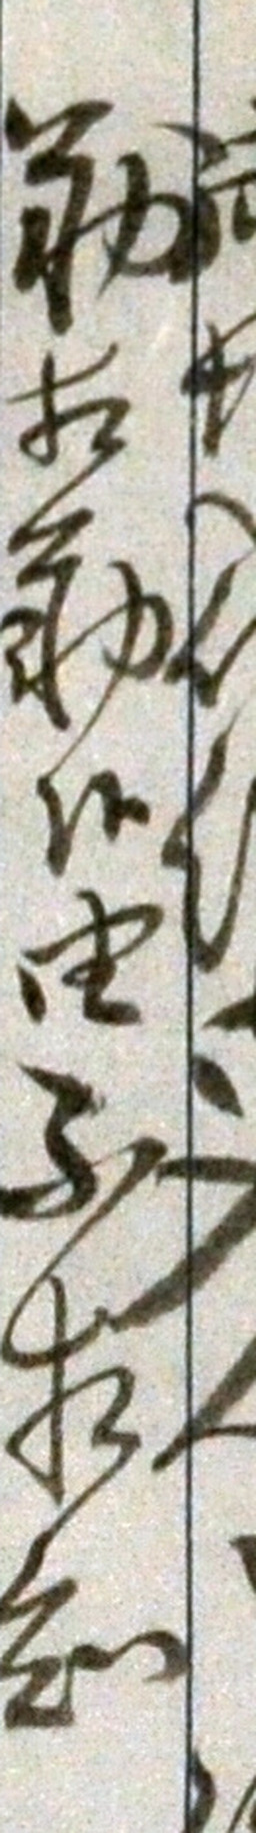勤相勤候由不相知
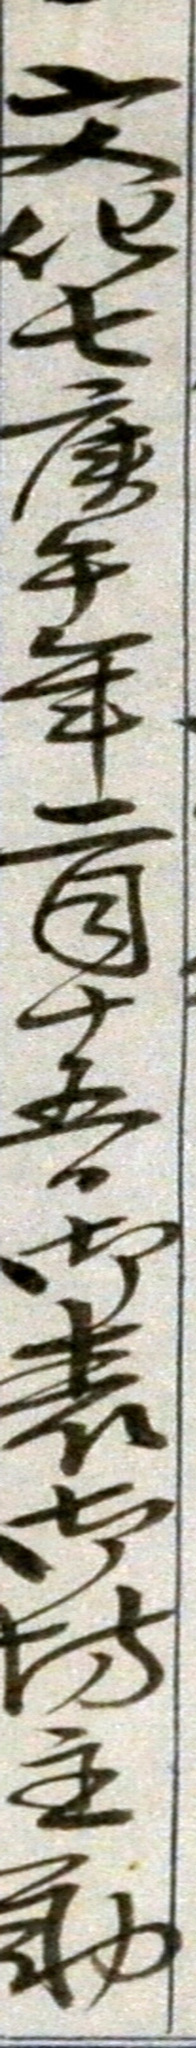一文化七庚午年二月十五日御表御坊主勤
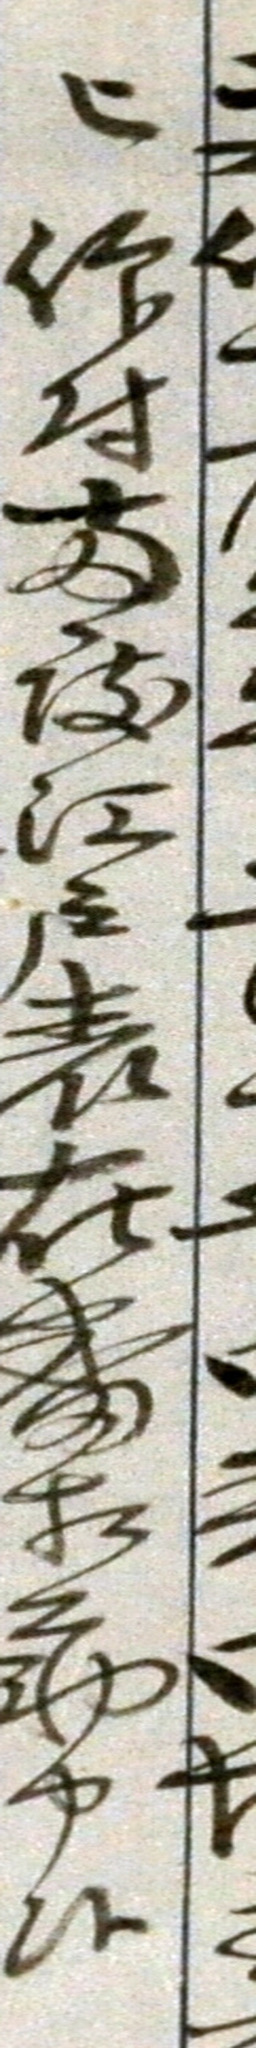被仰付両度江戸表在番相勤申候
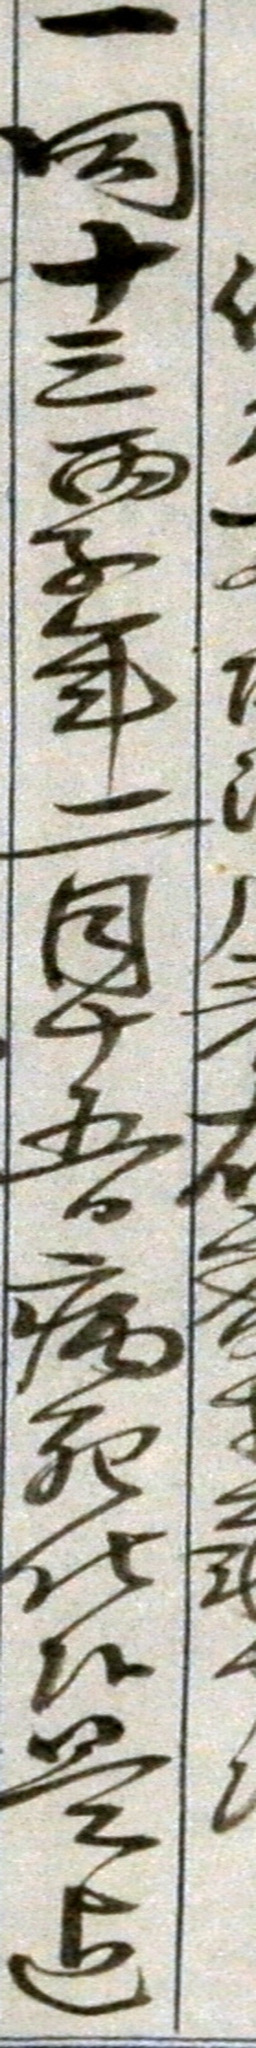一同十三丙子年二月十五日病死仕候是迄
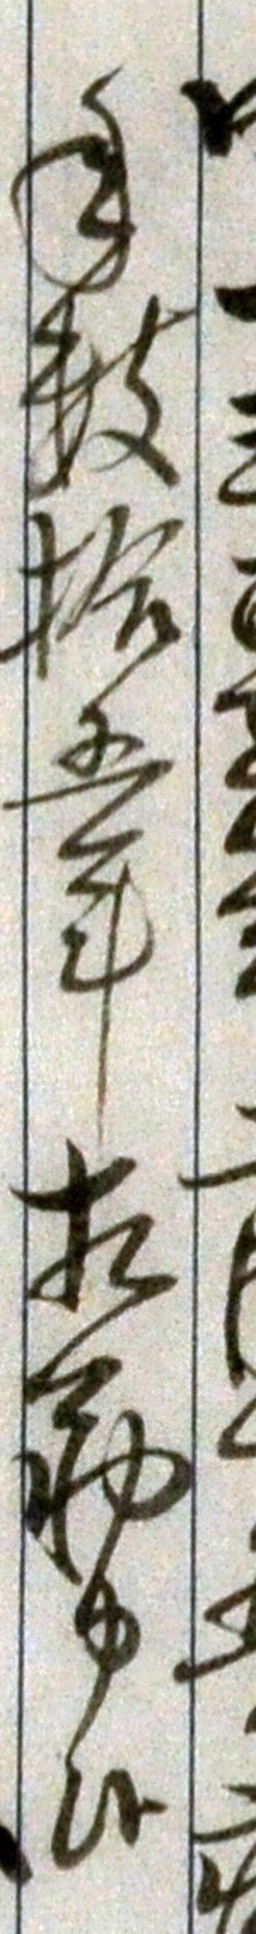年数拾五年相勤申候
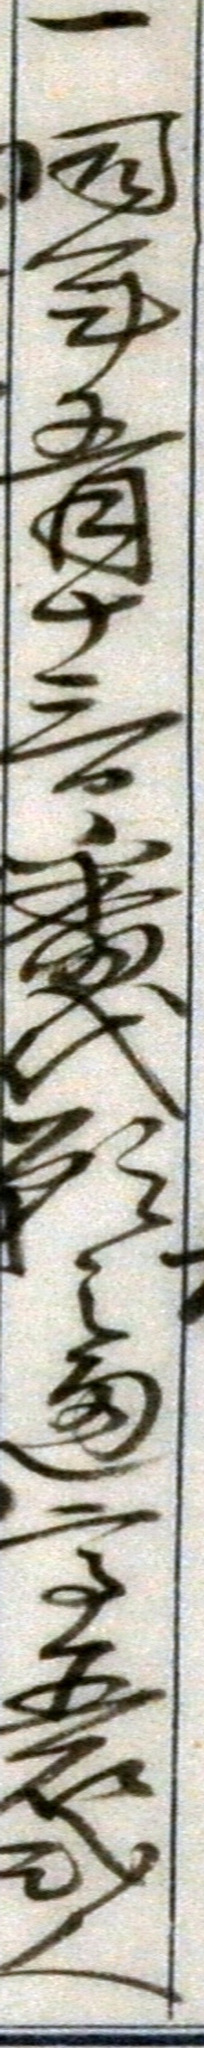一同年五月十三日番代願之通高五石弐人
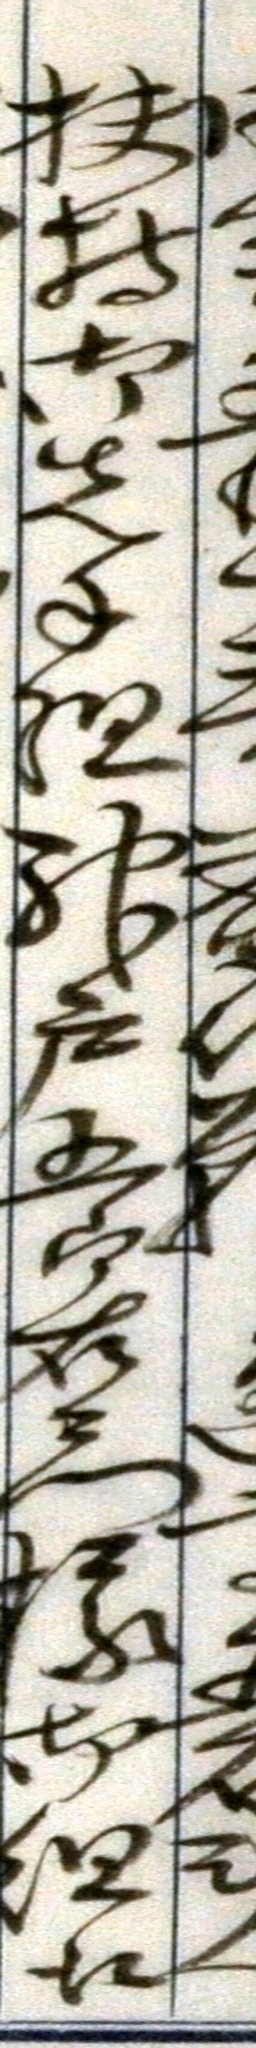扶持御先手組神戸五郎右衛門様御組江
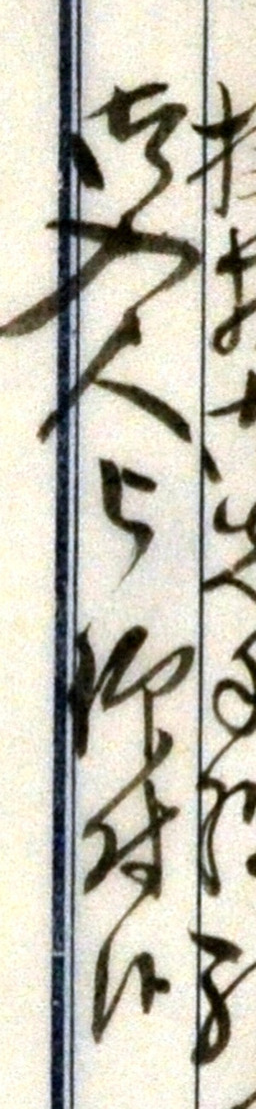御入人被仰付候
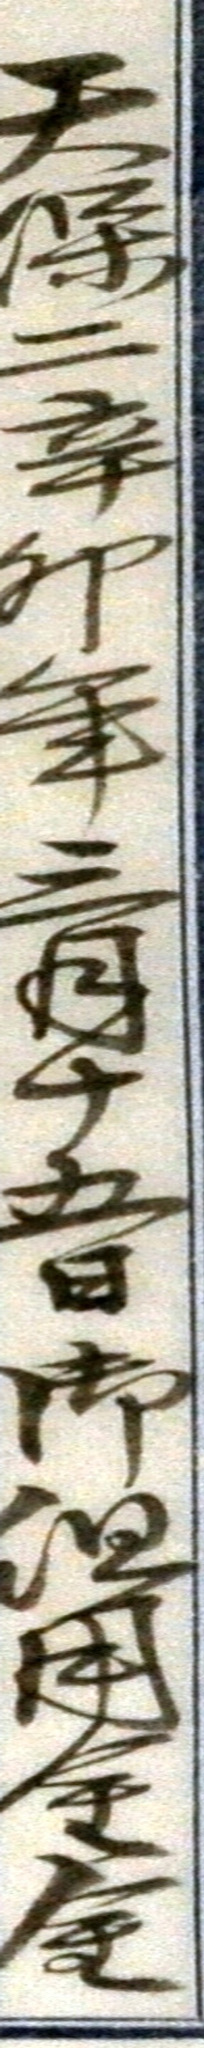一天保二辛卯年三月十五日御組用金金
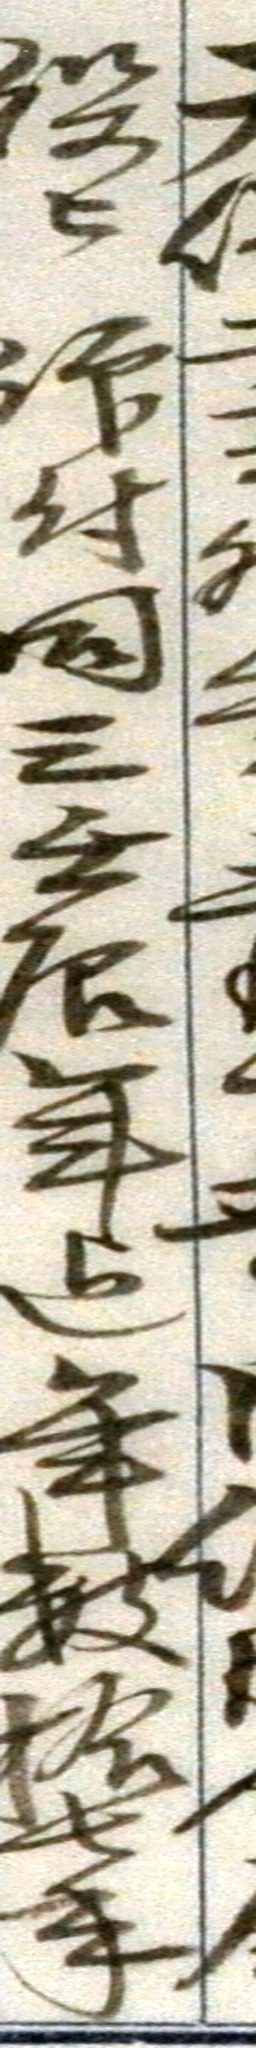役被仰付同三壬辰年迄年数拾七年
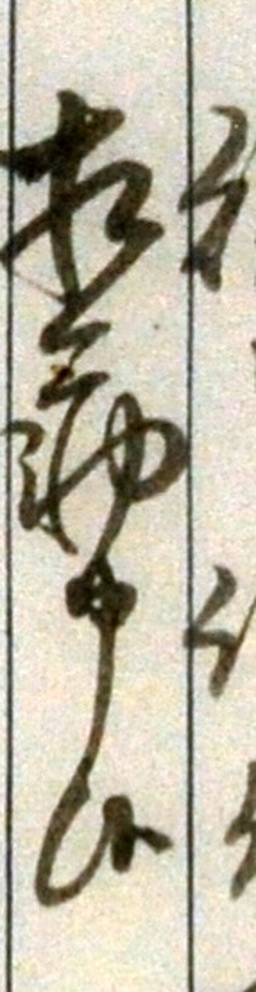相勤申候
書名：三好氏先代以来勤仕録、池田丈介一家勤仕録
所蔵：伊那市立高遠町図書館・合同会社AMANE
